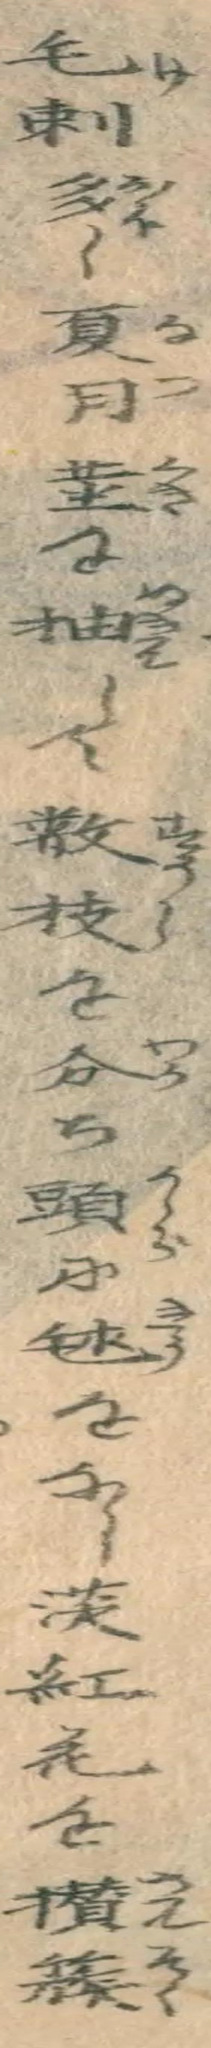毛剌多し夏月茎を抽して数枝を分ち頭に毬をなし淡紅花を攢簇
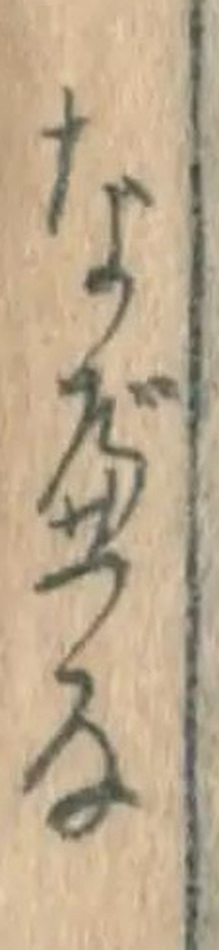なべな

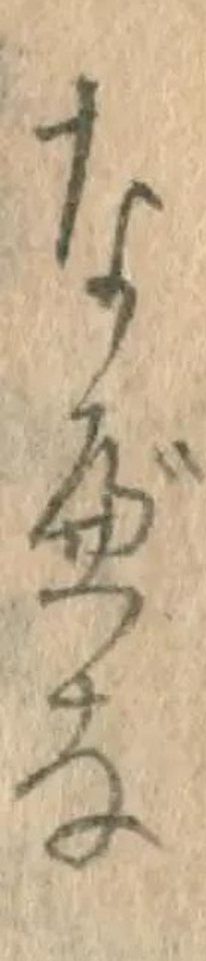なべな

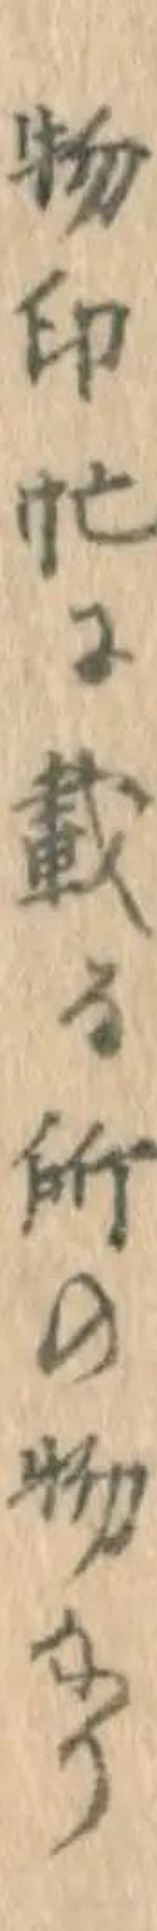物印忙に載る所の物なり
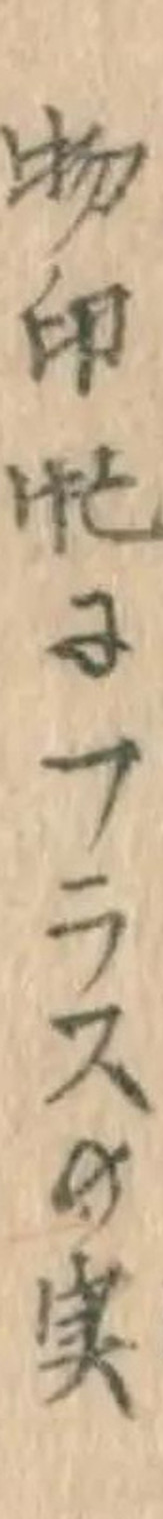物印忙にフラスの実
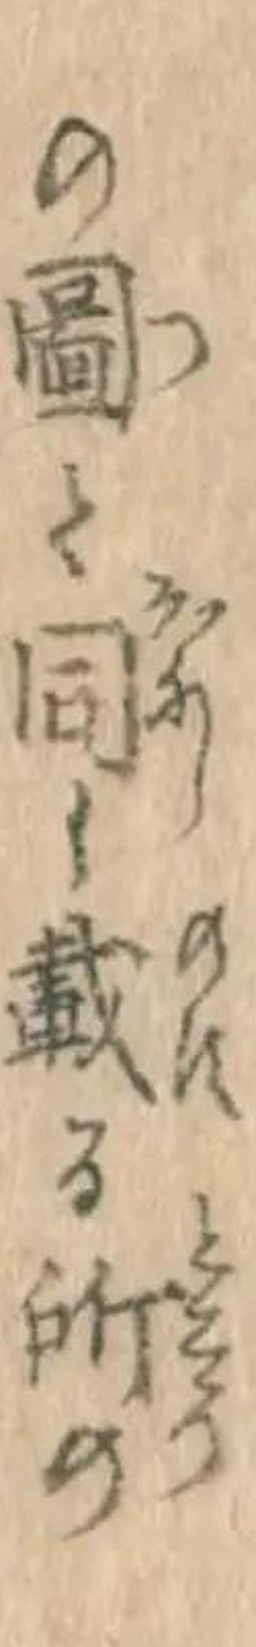の図と同く載る所の
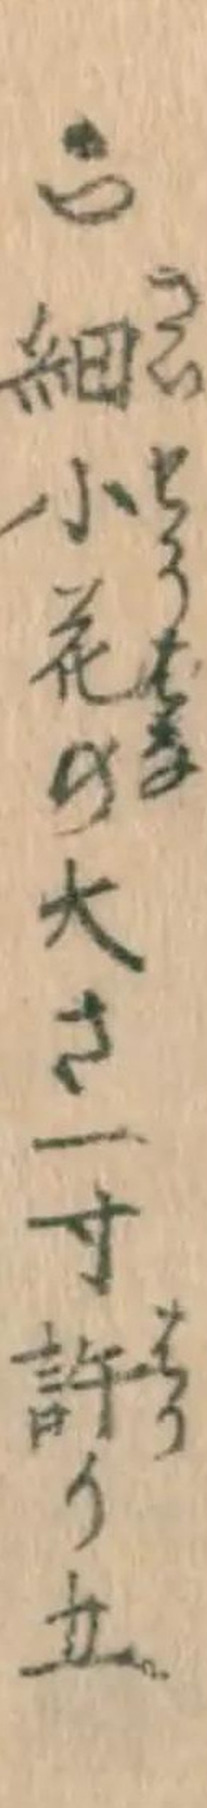●○細小花の大さ一寸許り五
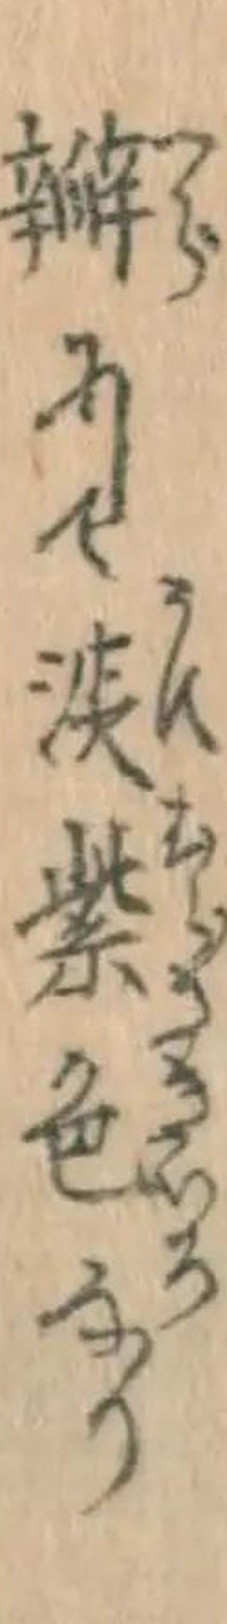弁にして淡紫色なり
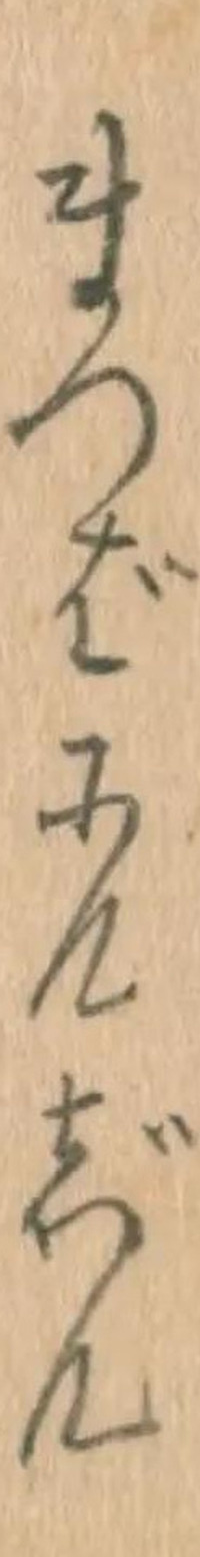まつはにんしん
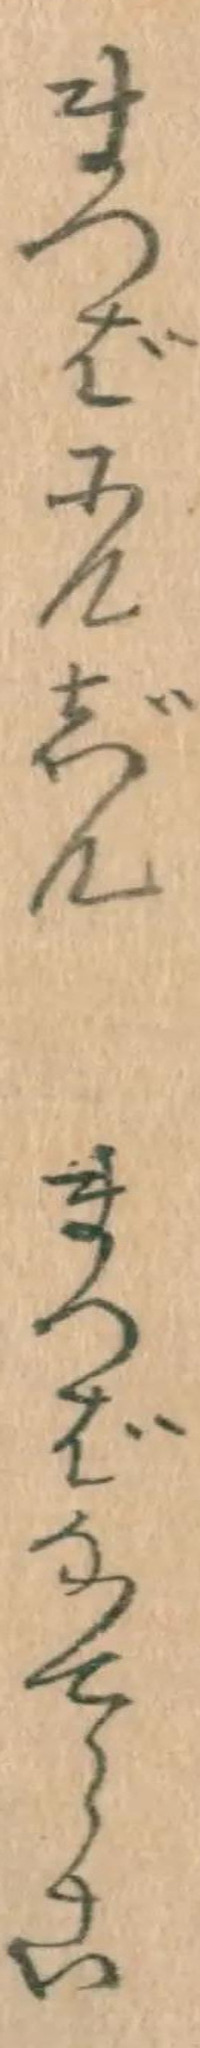一種まつばにんじんまつばなてしこ
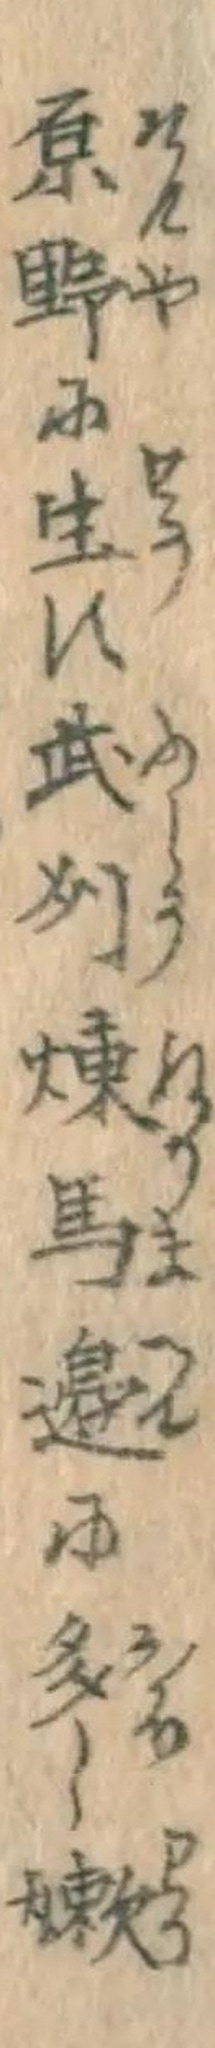原野に生す武州練馬辺に多し嫩
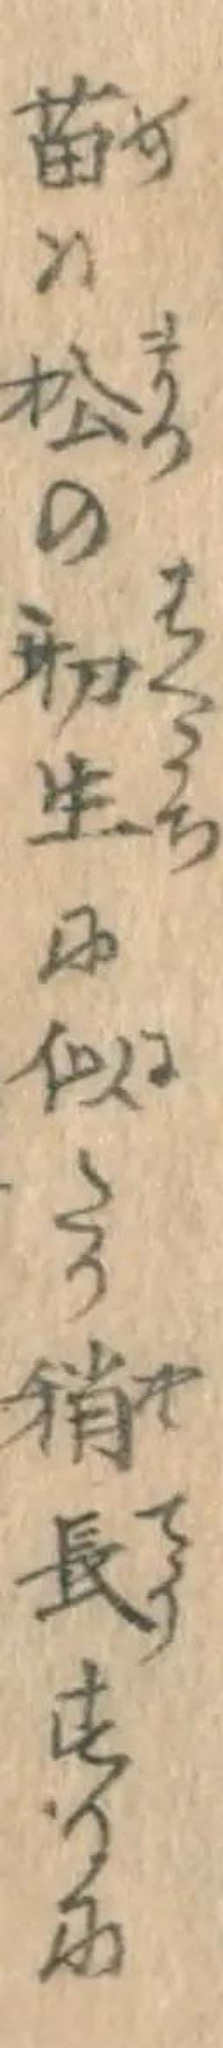苗は松の初生に似たり稍長するに
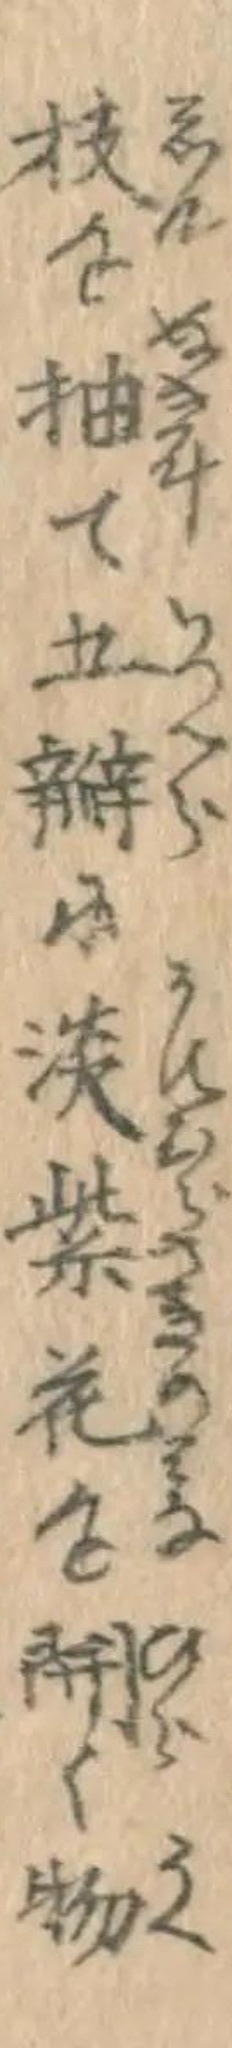枝を抽て五弁に淡紫花を開く物
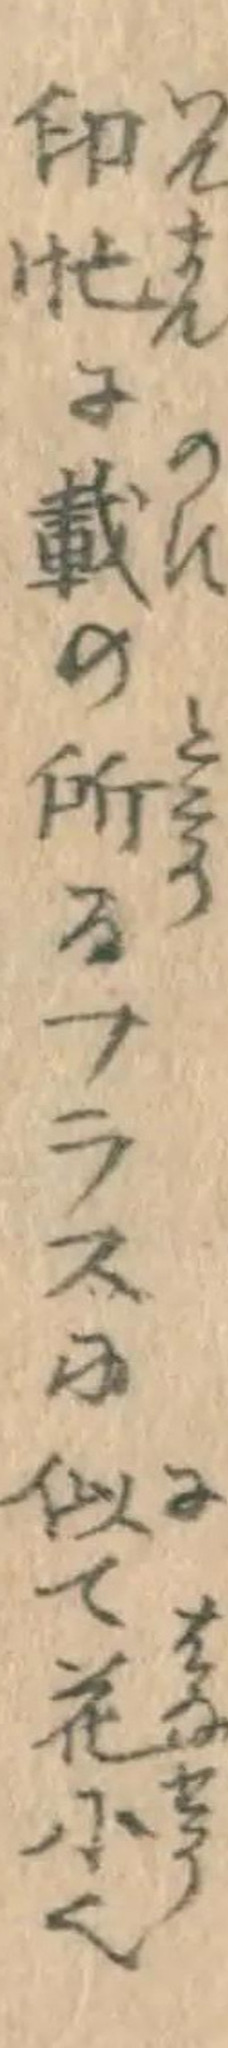印忙に載の所ろフラスに似て花小也
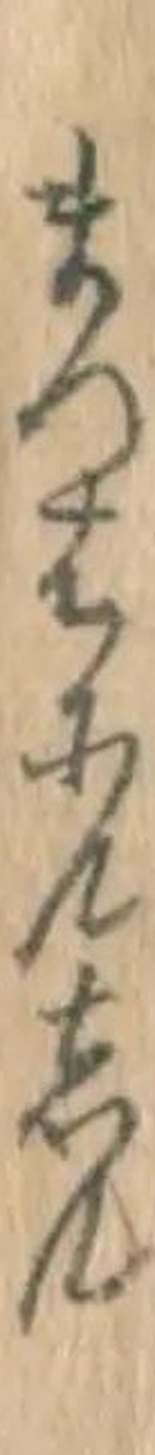まつはにんしん

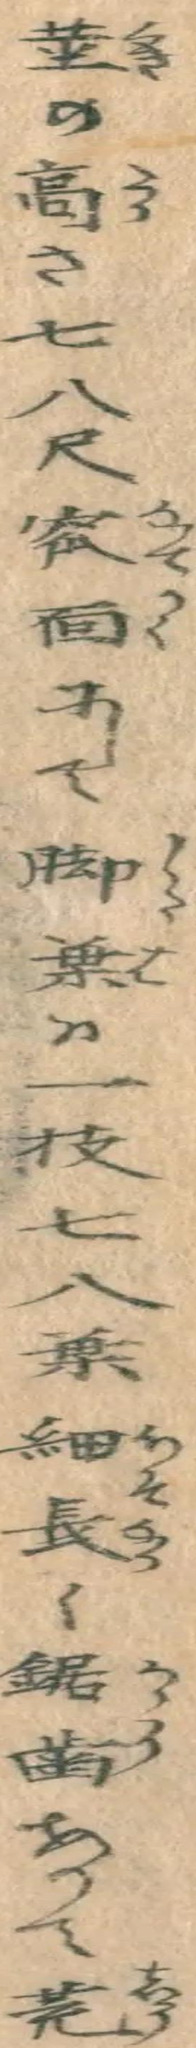茎の高さ七八尺窊面にして脚葉は一枝七八葉細長く鋸歯ありて茺
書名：本草図譜. 巻40-42
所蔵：国立国会図書館 National Diet Library, JAPAN
